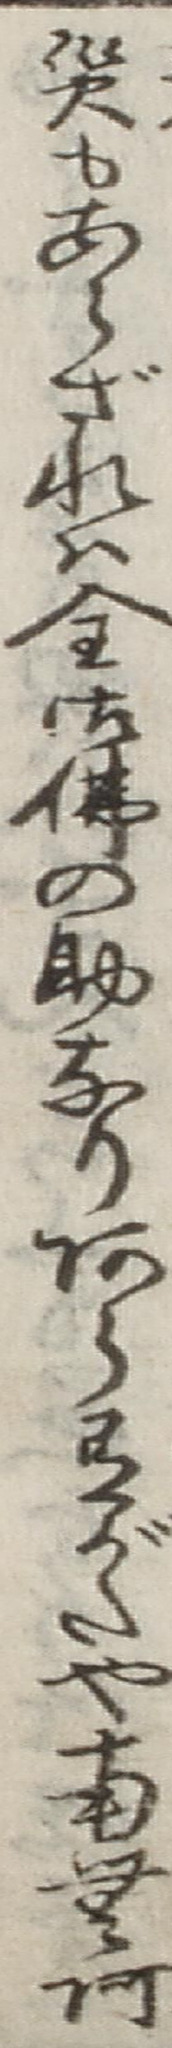災もあらざれハ全御佛の助なりあら有がたや南無阿
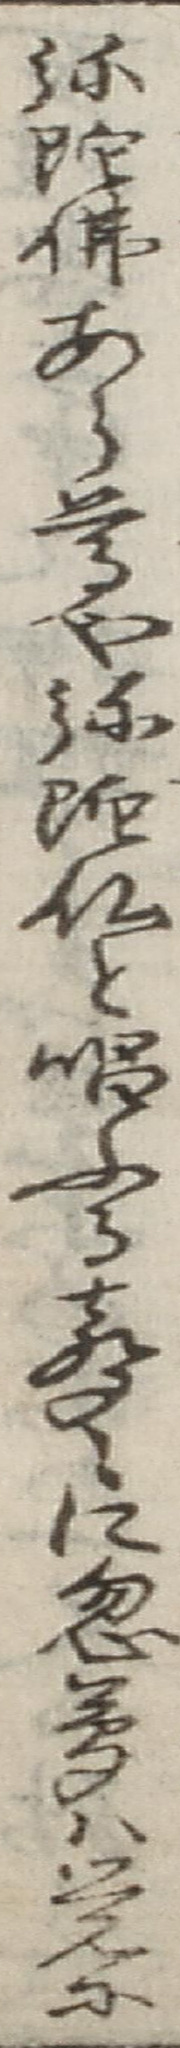弥陀仏あら尊や弥陀仏と唱ふる聲〻に忽夢ハ覚に
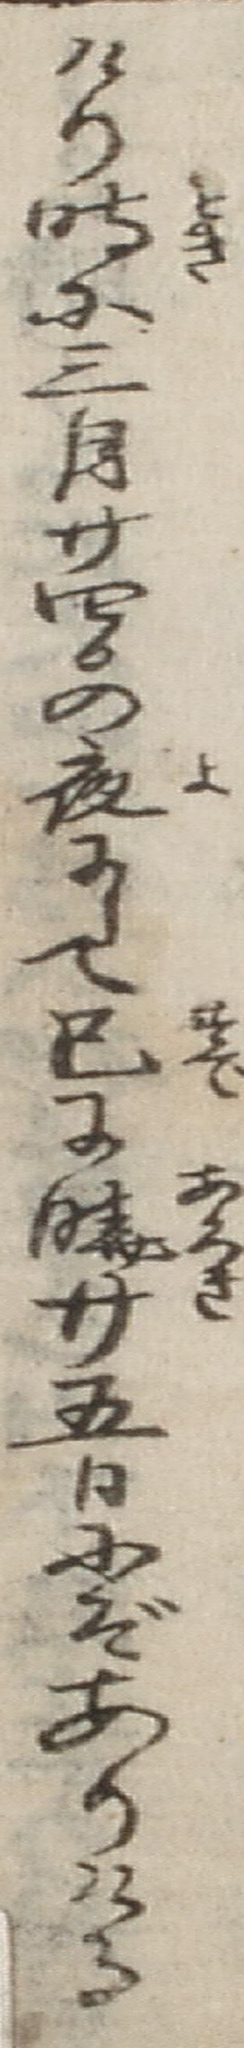けり時に三月廿四日の夜にして已に暁廿五日にぞありける

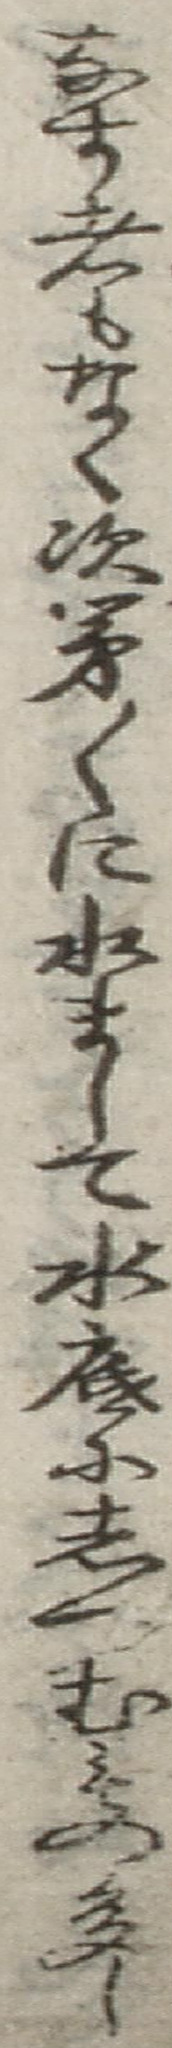なす者もなく次第〳〵に水まして水底にしつむもの多し
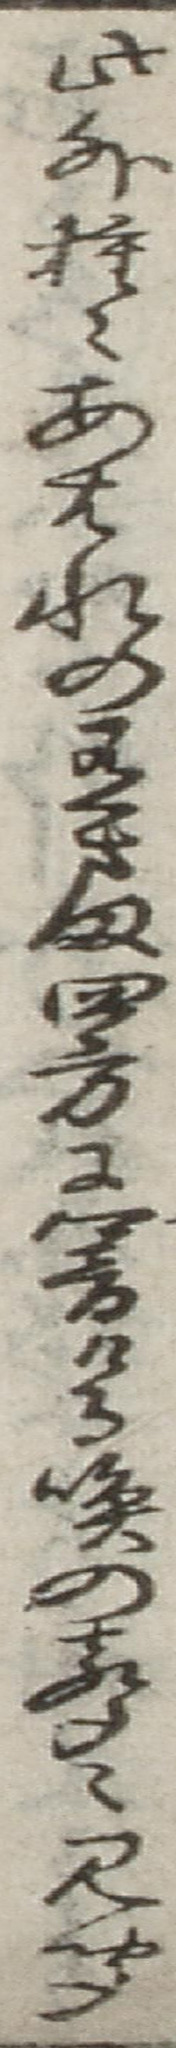此外種〻あはれの有さま四方に響ける喚の声〻見聞
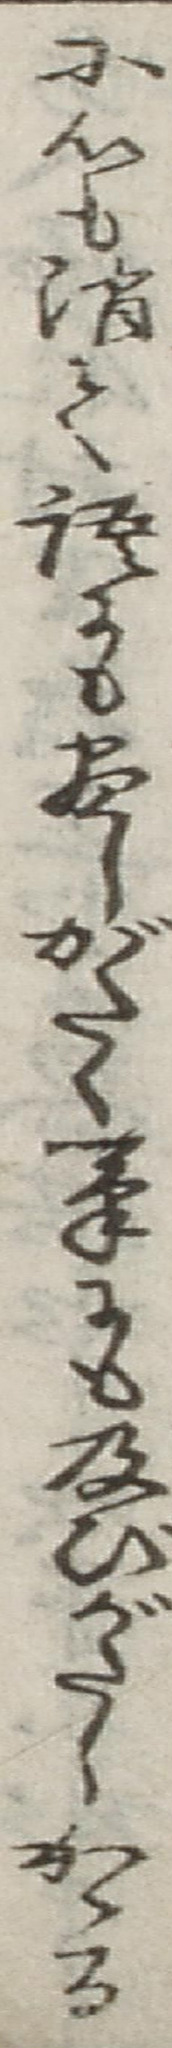に心も消て語にも尽しがたし筆にも及びがたしかゝる
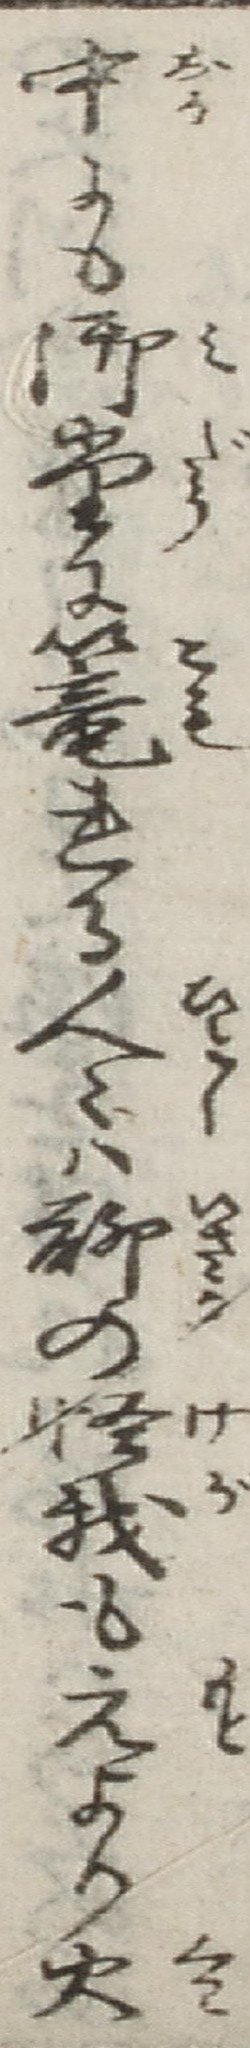中にも御堂に篭れる人〻ハ聊の怪我も元より火
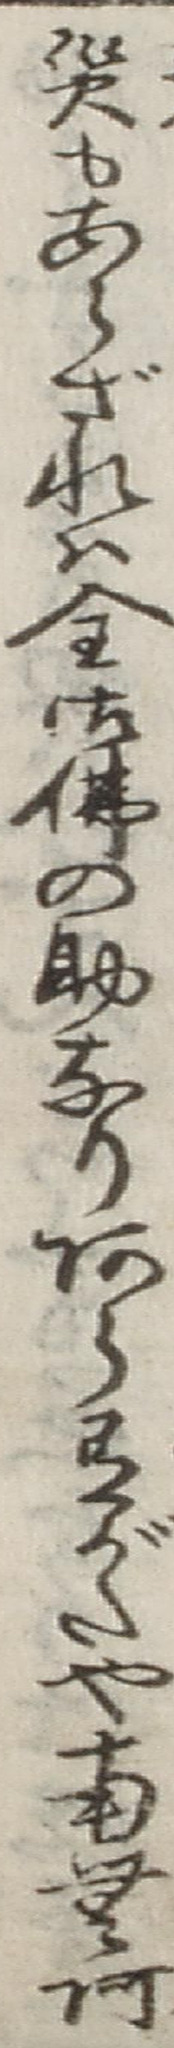災もあらざれハ全御仏の助なりあら有がたや南無阿
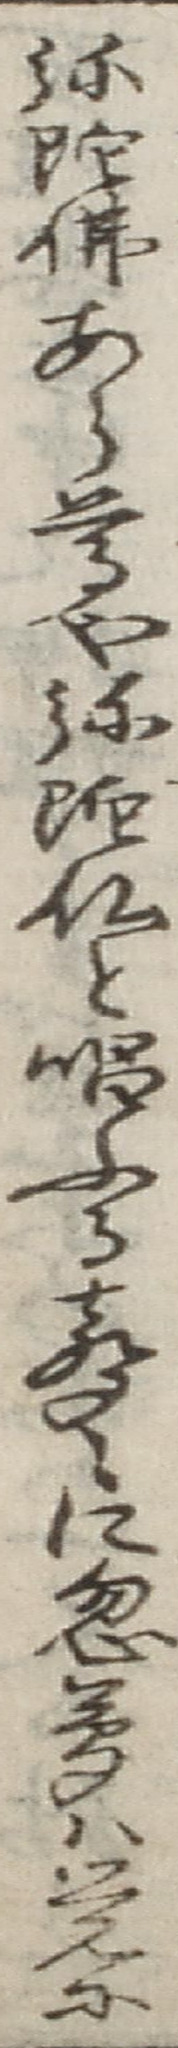弥陀仏あら尊や弥陀仏と唱ふるに忽夢ハ覚に
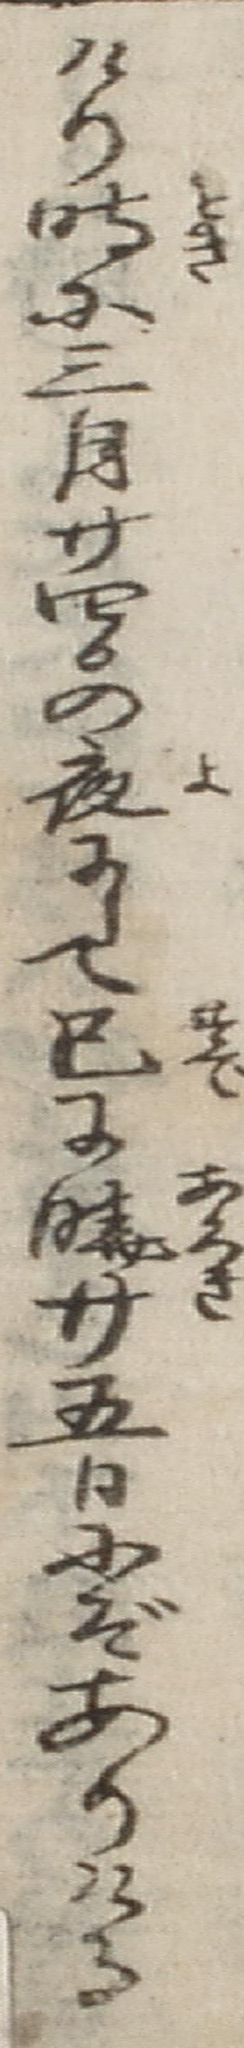けり時に三月廿四日の夜にてにして已に暁廿五にぞありける
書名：地震世直草紙　全
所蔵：東京大学地震研究所図書室 Earthquake Research Institute Library, The University of Tokyo, JAPAN
